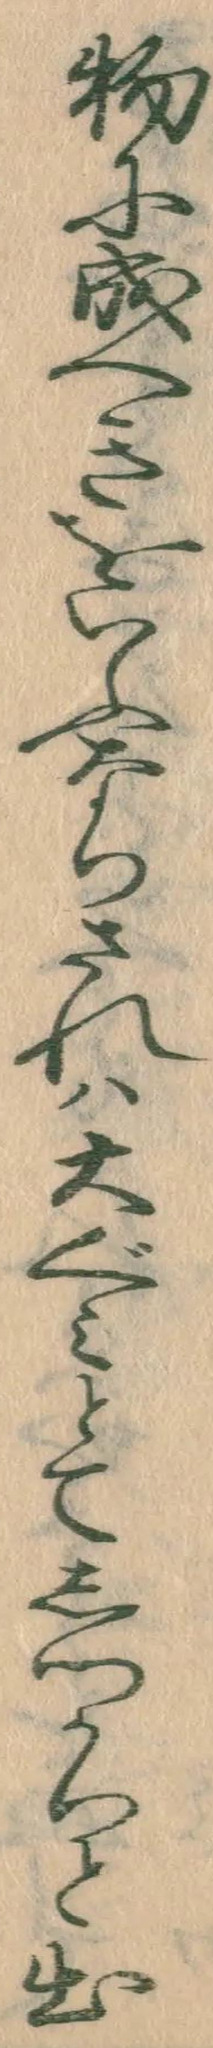物に成へきをいふなりされは大ぐみとてしつかりと出
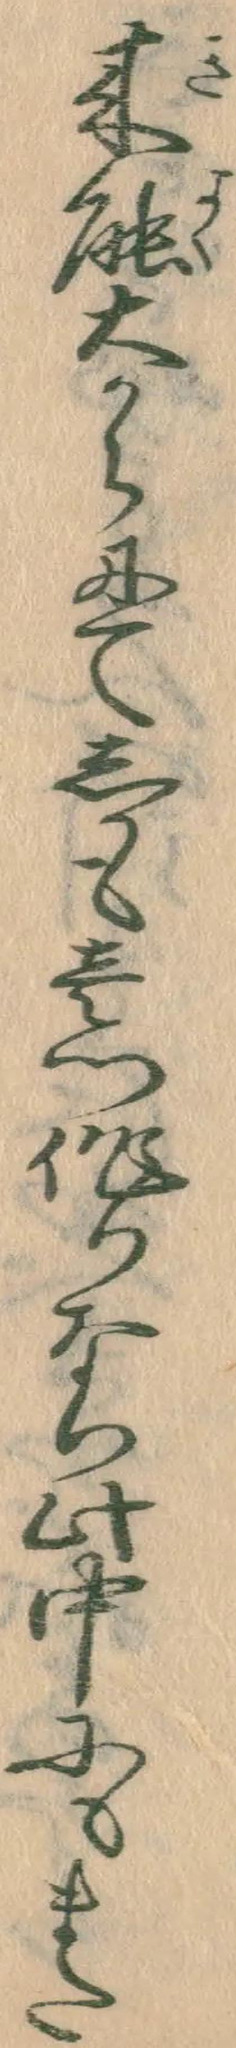来能大からにてしかも壱つ作りなり此中にもまた
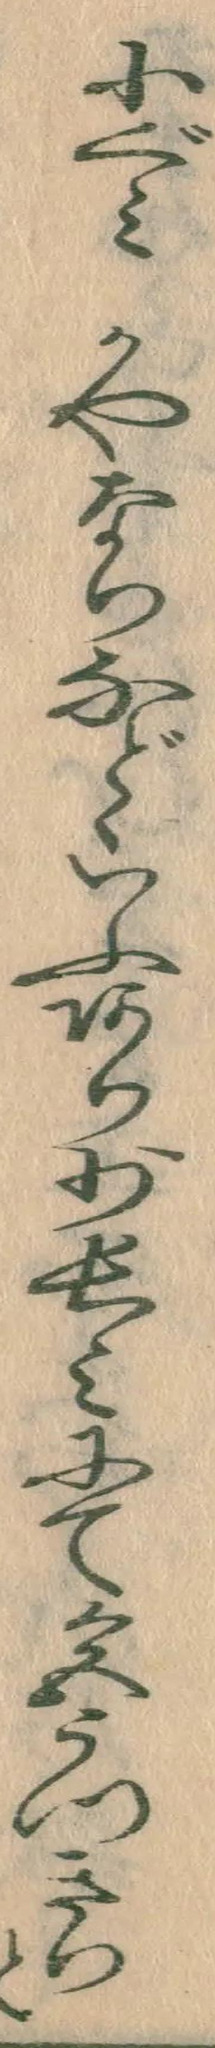小ぐみかやなりなどゝいふあり少長みにて色うつきりと
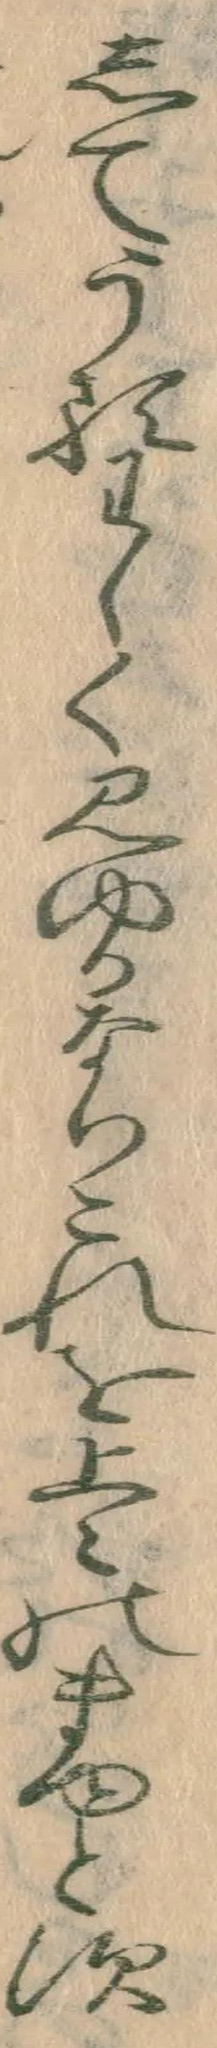してうるわしく見ゆるなりこれを上々のまゆとす
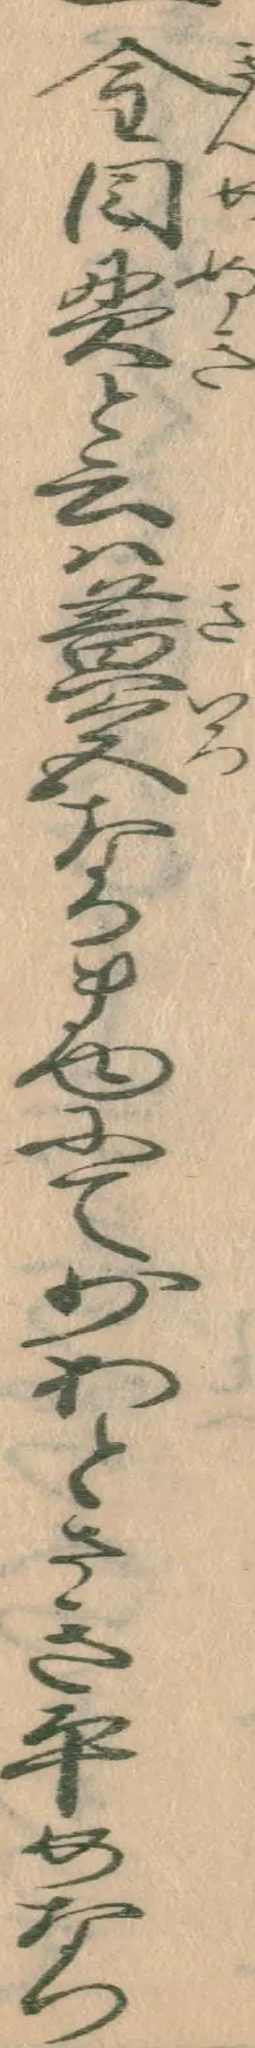一金目貫と云は黄色なるまゆにて少あとさき平めなり
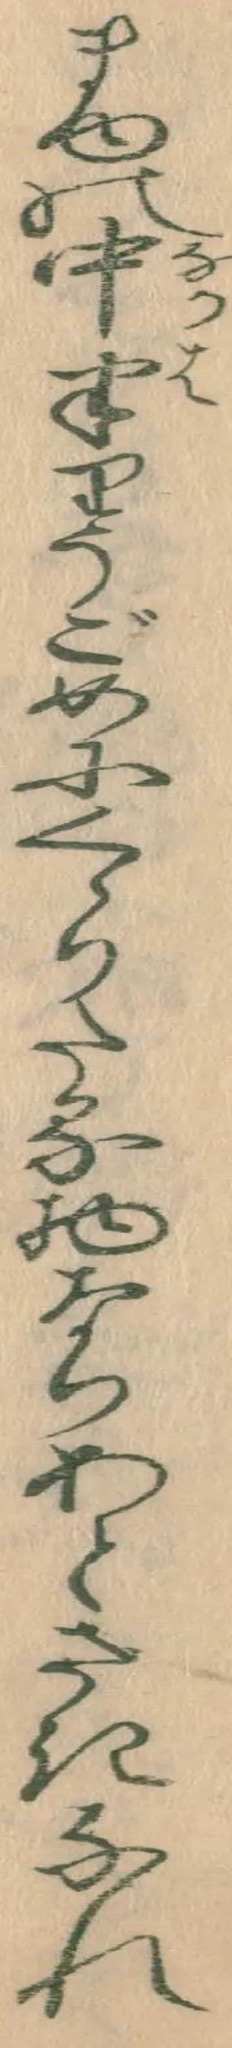まゆの中半りうごめにくゝりたる物なりあとさきなれ
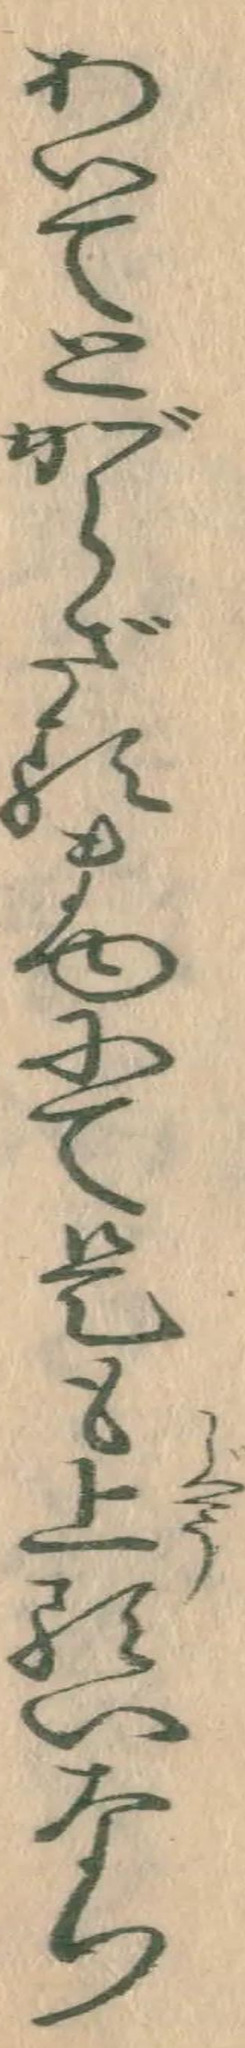あいてとがらざるまゆにて是も上類いなり
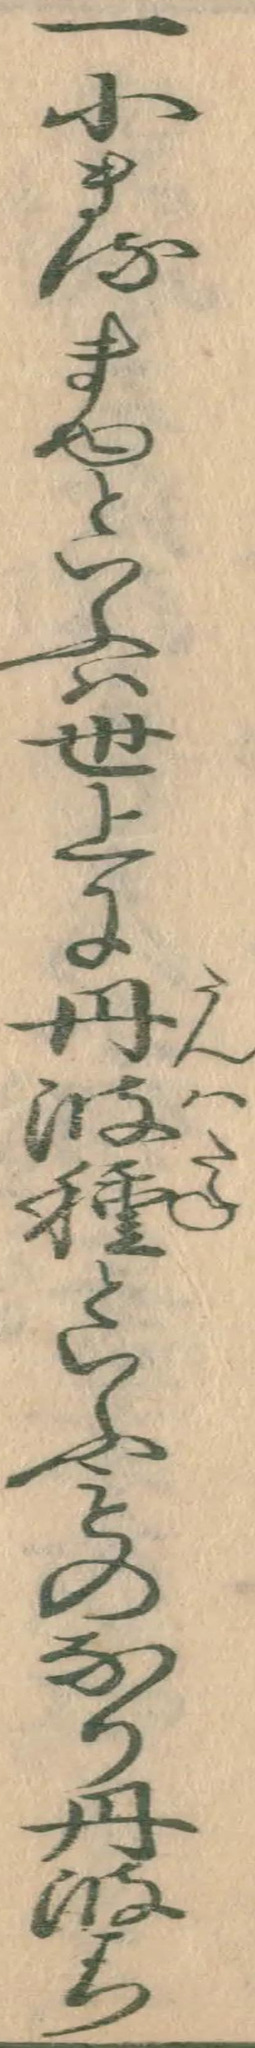一小まるまゆといふは世上に丹波種といふものなり丹波より
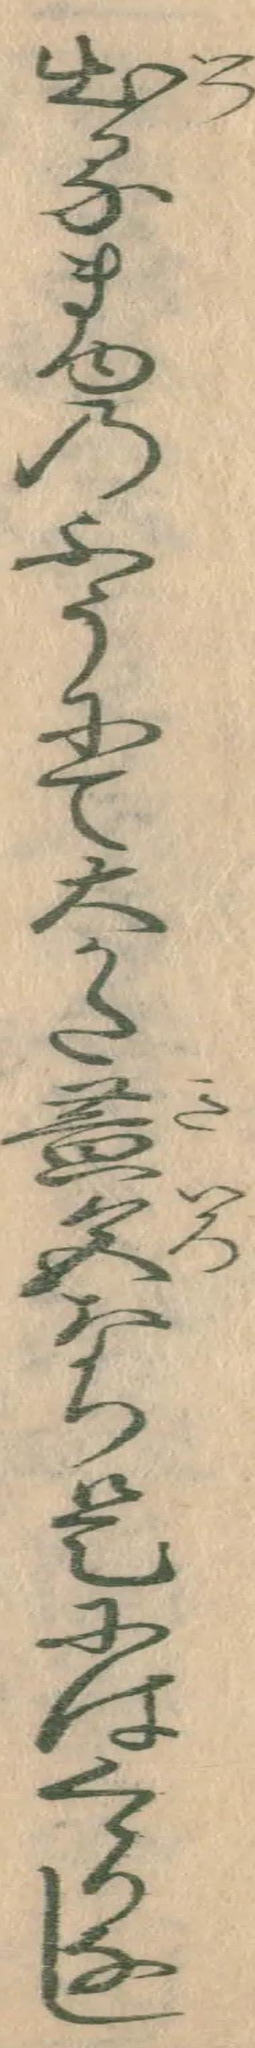出るまゆのふうにて大かた黄色なり是にはくゝりなし
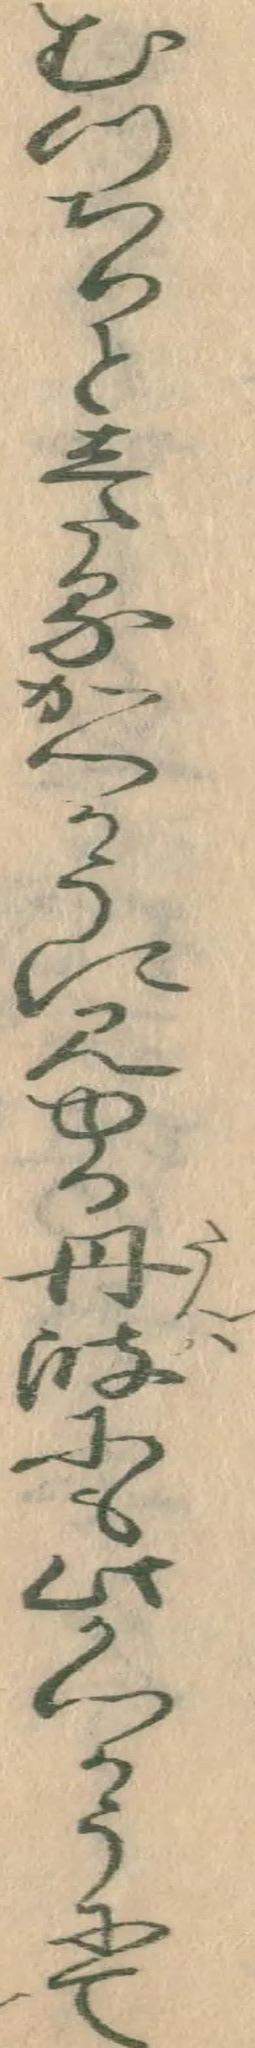むつちりとしたるかつかうに見ゆる丹波にも此かつかうにて
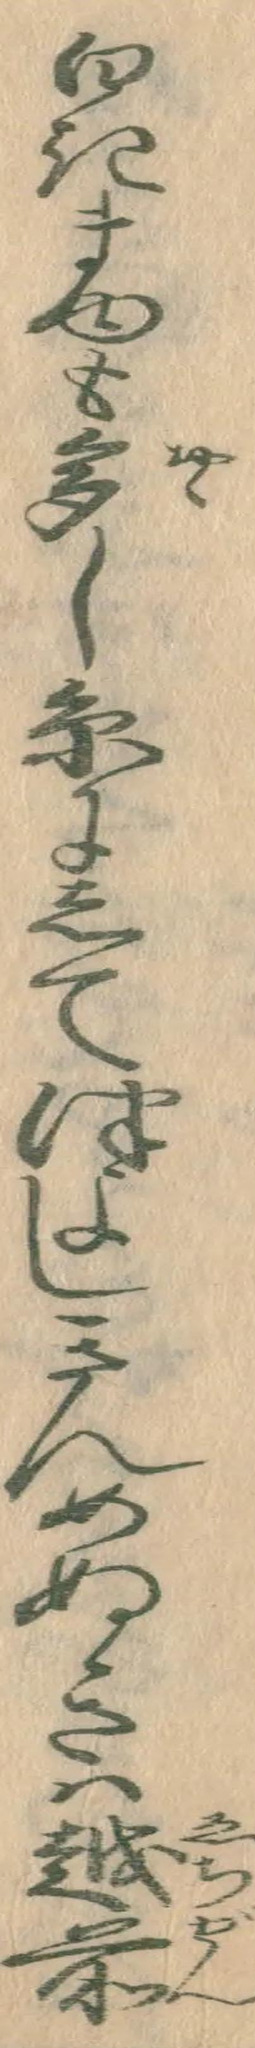白きまゆも多し糸にしてつよしきんめぬきは越前
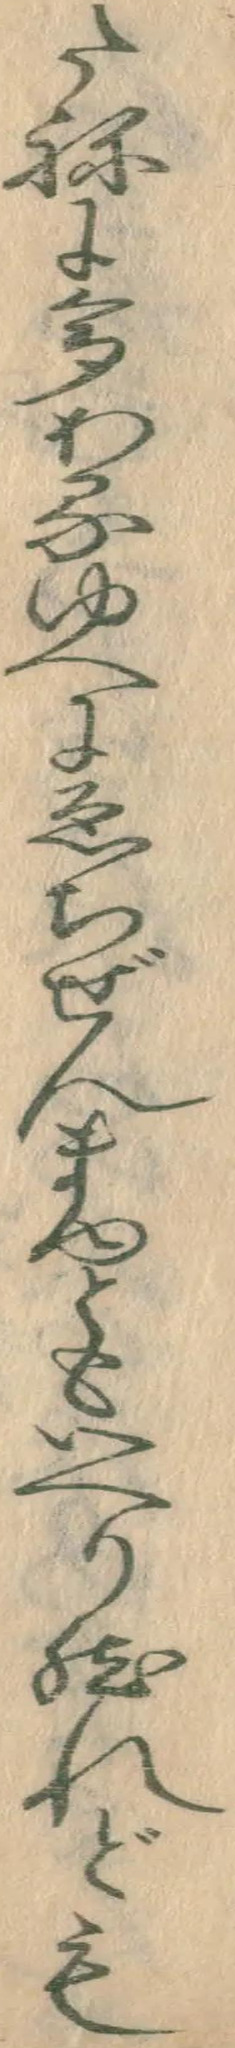たねに多あるゆへにゑちぜんまゆともいへり然れども
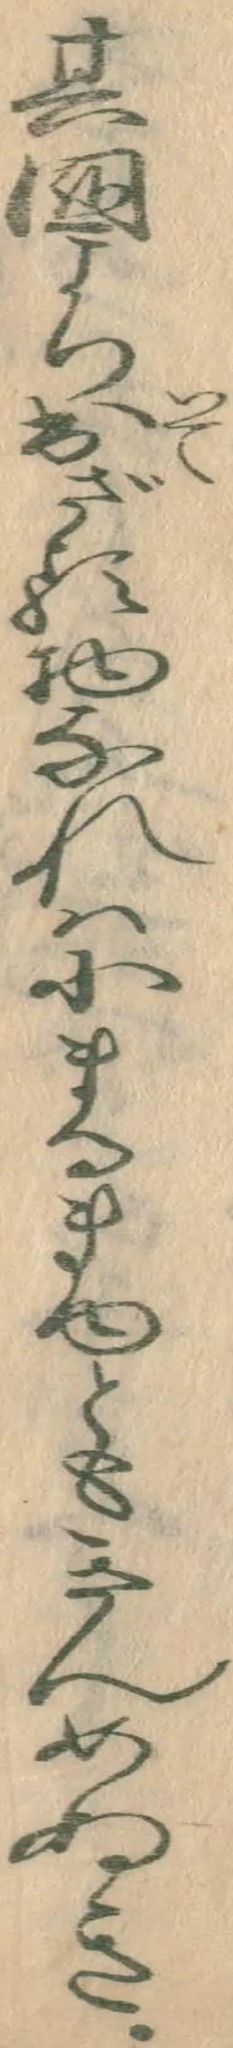其国より出ざる物なれは小まるまゆともきんめぬき。
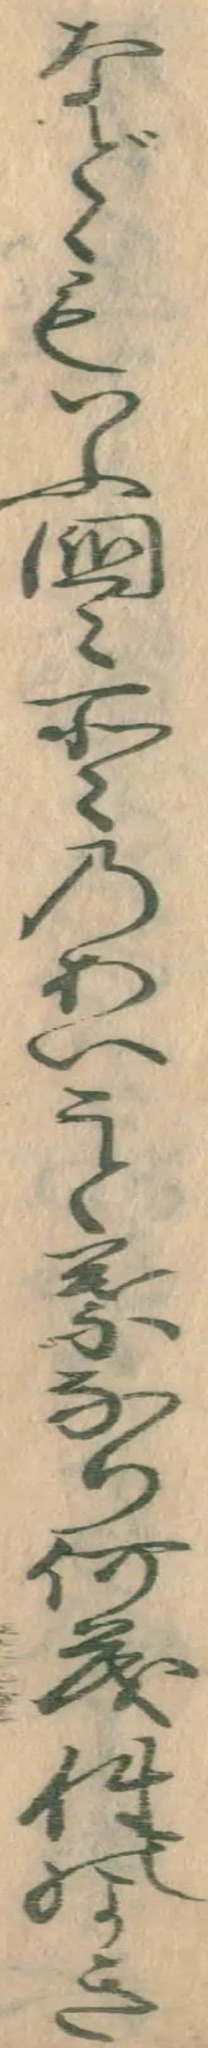などゝもいふ国々所々のあいこと葉なり何も性のよき
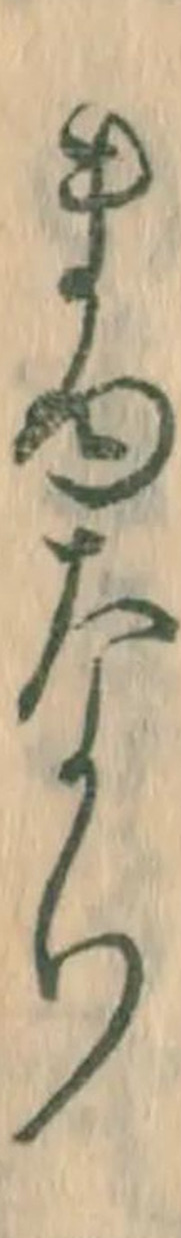まゆなり

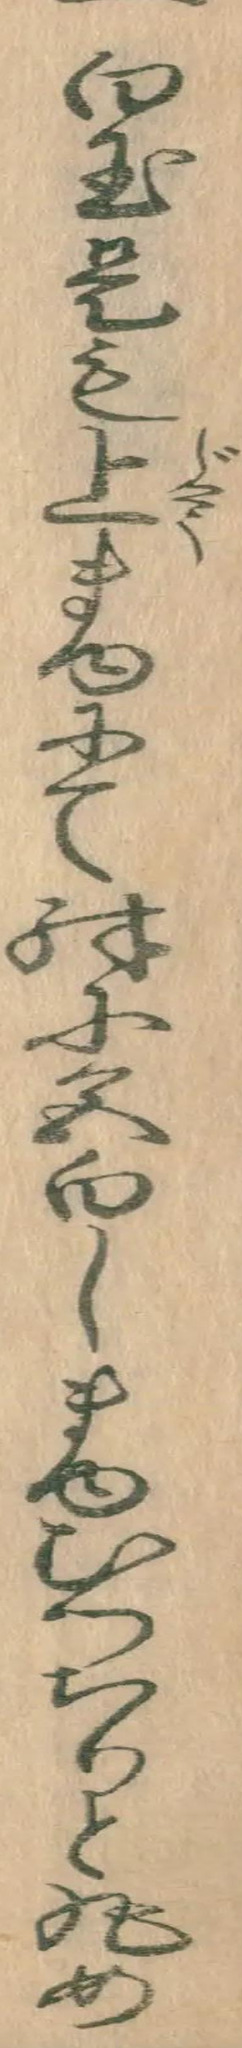一白玉是も上まゆにて殊に色白しまゆむつちりと丸め
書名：蚕飼養法記
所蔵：国立国会図書館 National Diet Library, JAPAN
